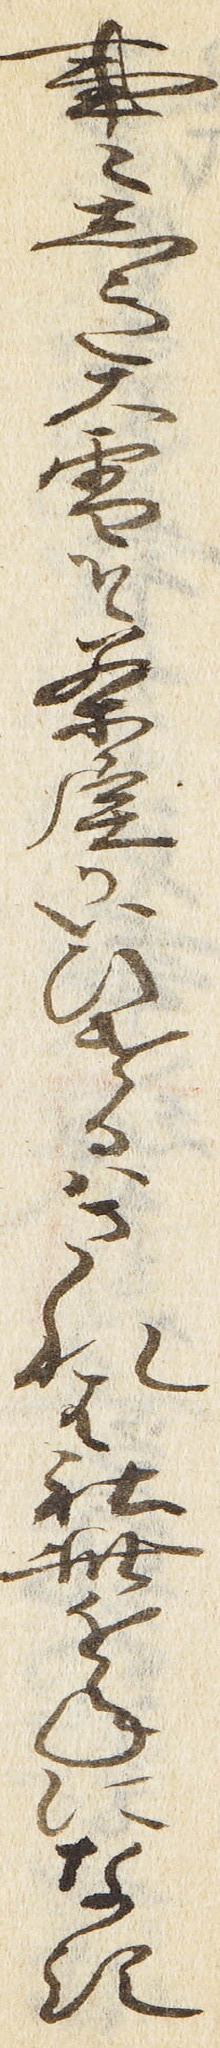事々しき大雪そ茶屋かいひけるはされは社此近年になき
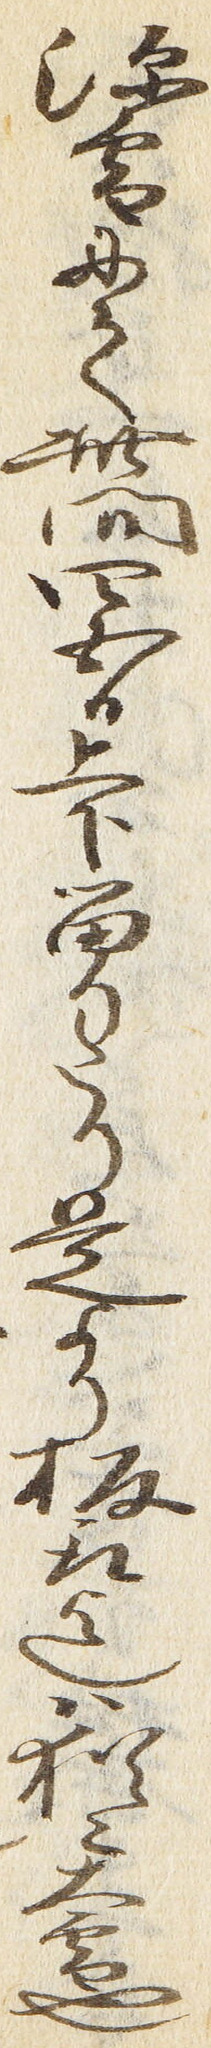深雪にて此間四五日上下留りたり是より板取迄は猶々大雪也
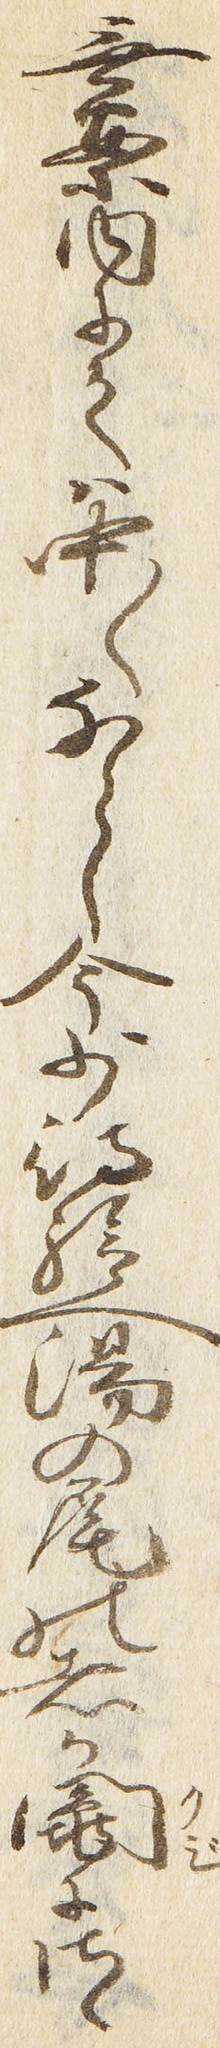無案内にては中〳〵ならし今少待給へ湯の尾の者か鬮にさゝ
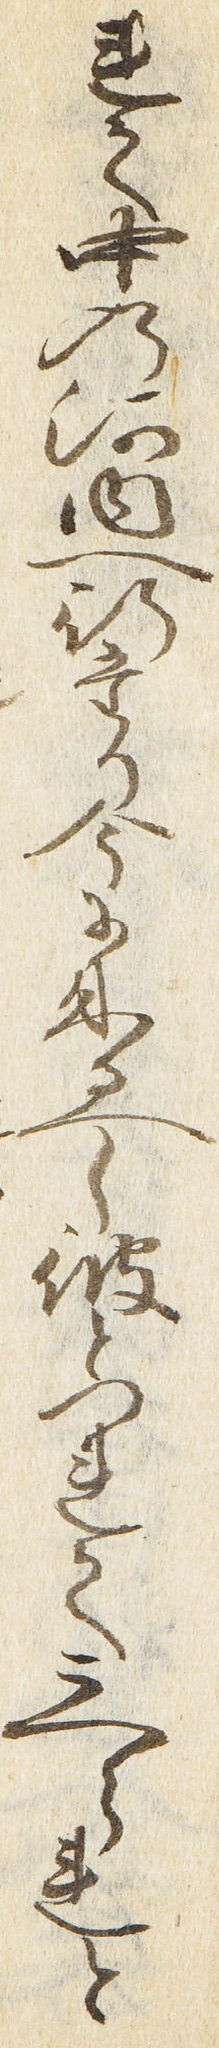れて中の河内へ行たり今に来るへし彼とつれてこへられと
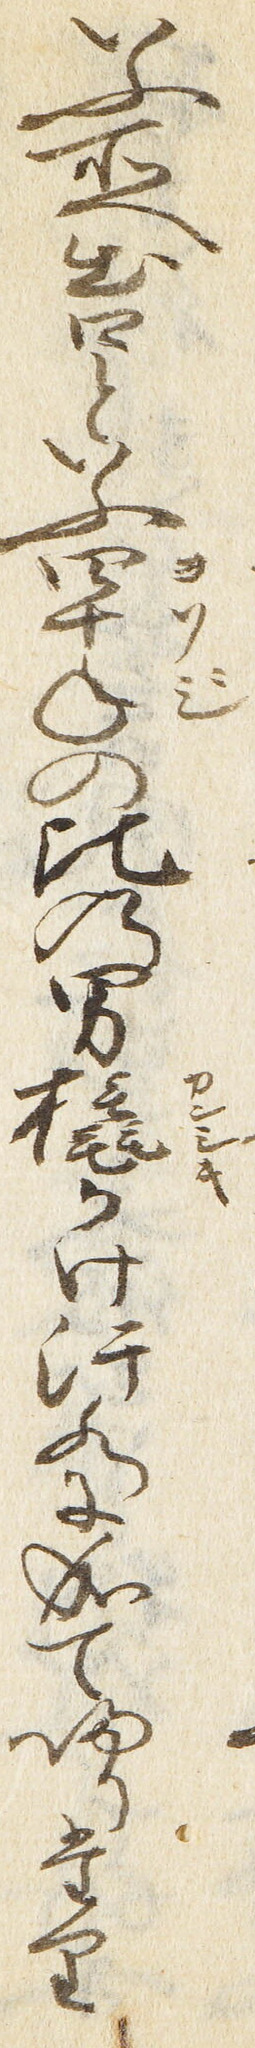いふ所へ出口といふ四十年の比の男橇かけ汗水に成て帰りたり
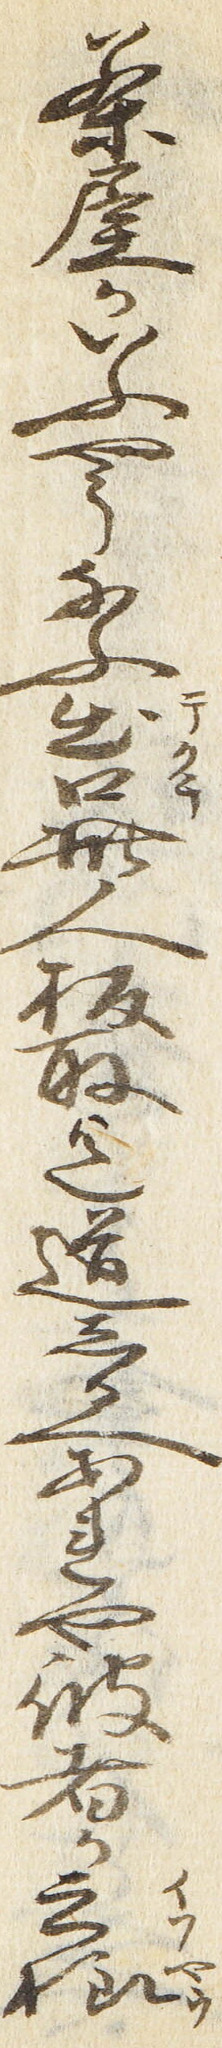茶屋かいふやうなふ出口此人板取迄道しるへあれや彼者か云様
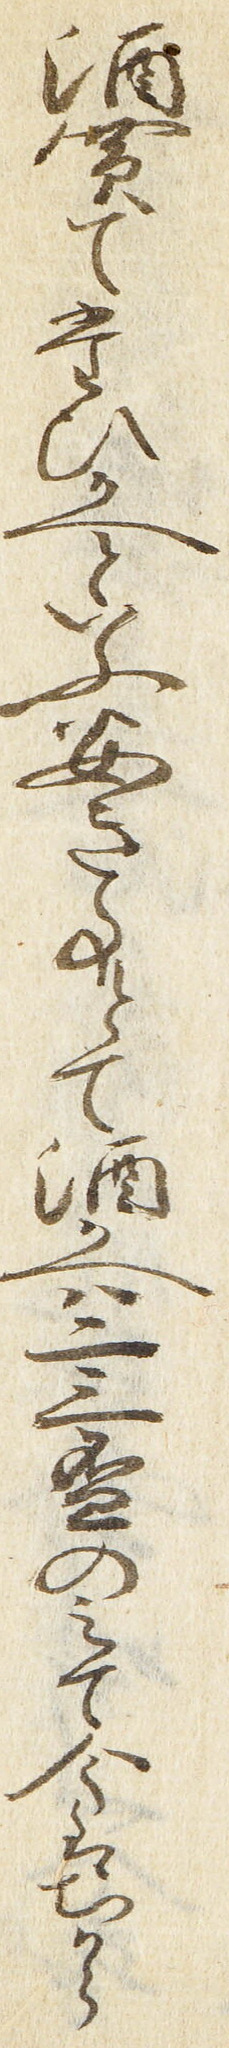酒買てたひ候へといふ安き事とて酒かへは二三盃のみて今はちから
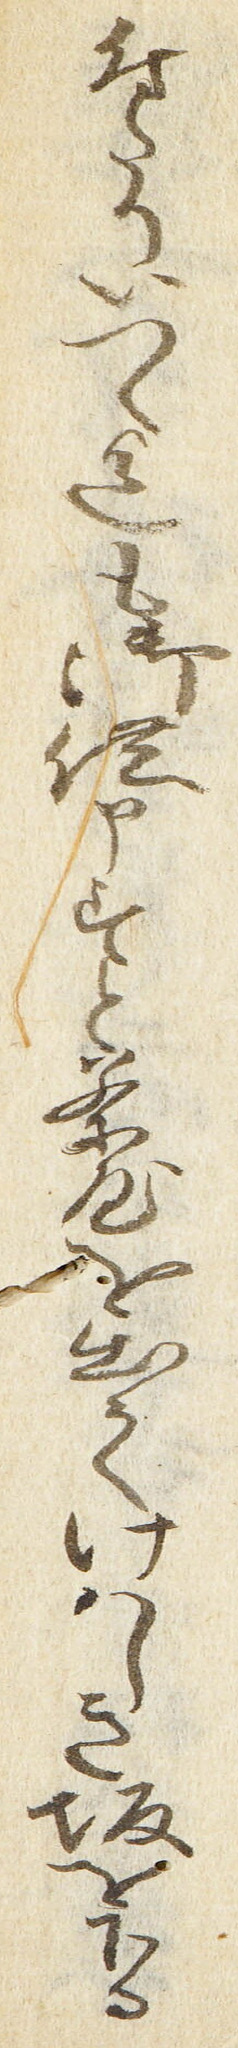付たりいつく迄も御供申すと茶屋を出てけはしき坂を下る

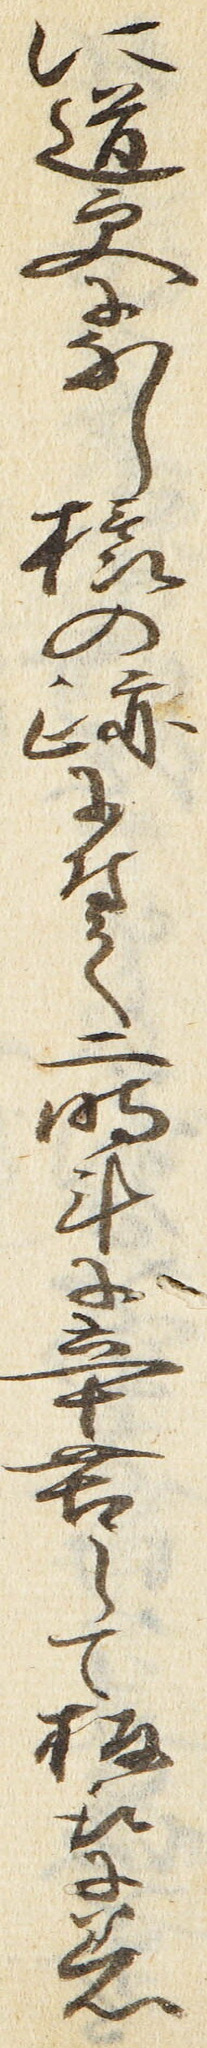に道更になし橇の跡に付て二時計に辛苦して板取に着
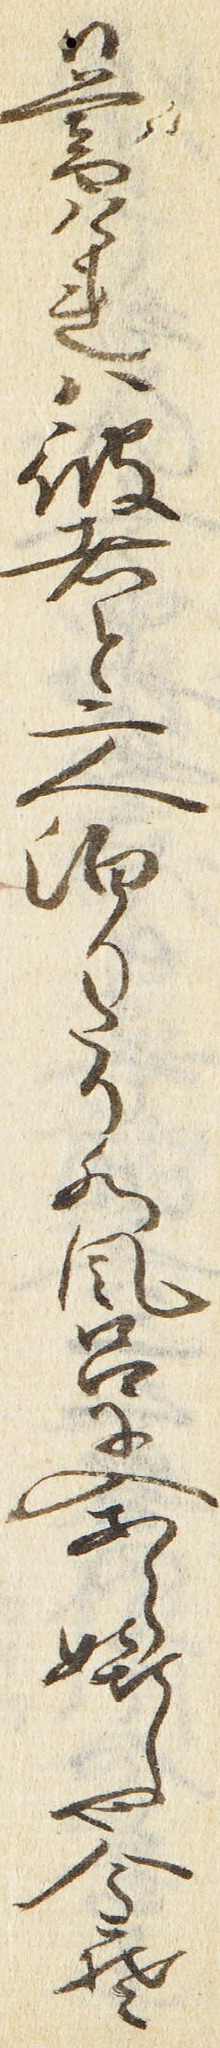日暮けれは彼者と二人泊りたり水風呂に入あら嬉しや今こそ
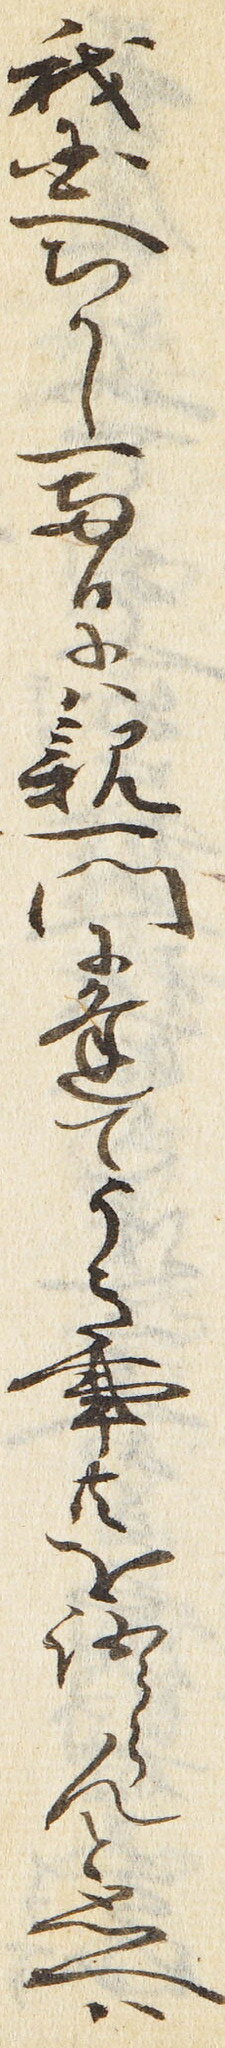我国へちかし一両日には親一門に逢てうき事共を語らんと思へは
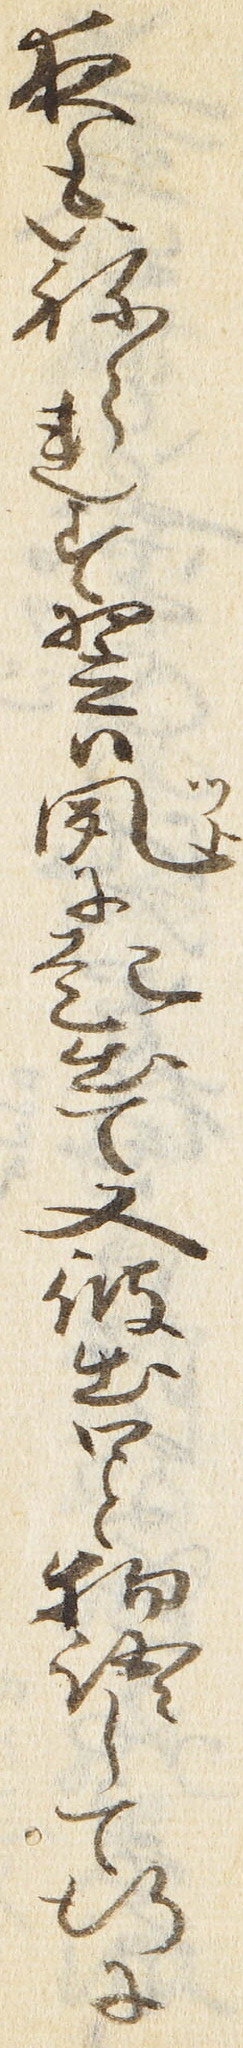夜もいねられす翌日夙に起出て又彼出口と物語して行に
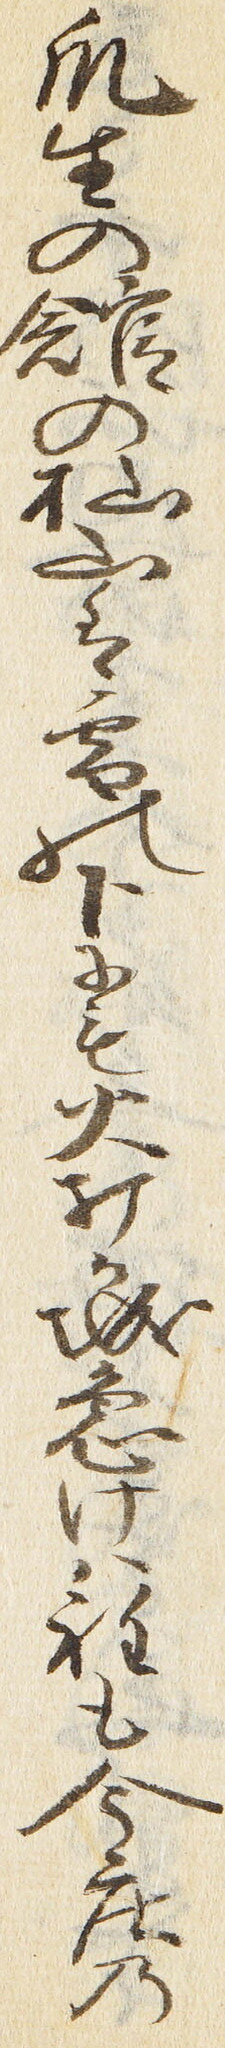瓜生の館の杣山は雪の下にも火打か城急けは程も今庄の
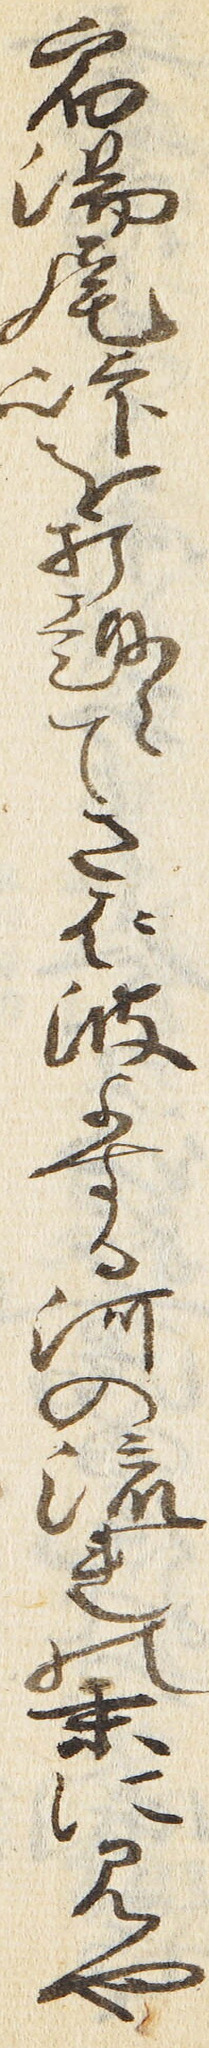宿湯尾峠を打越えてさば波よする河の流れの末に見や
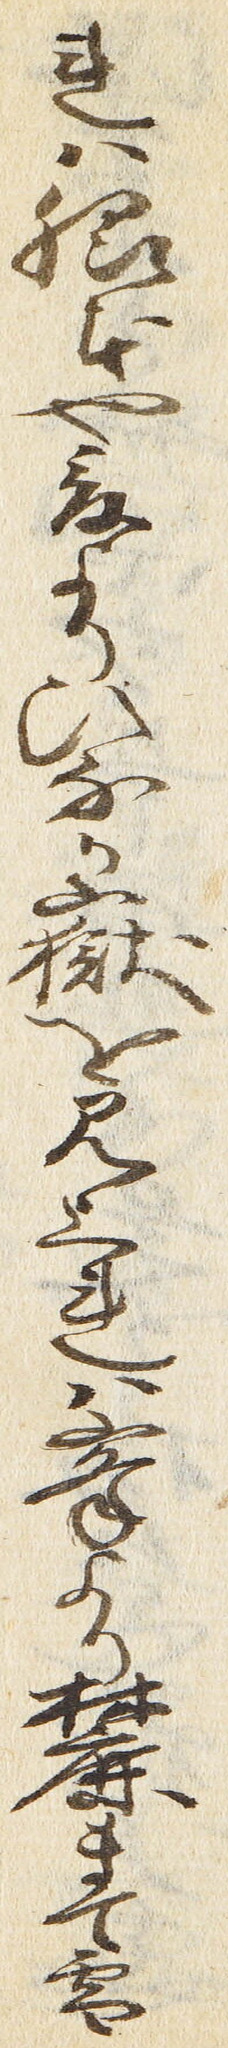れは脇本也爰よりひなか嶽を見上れは峯より麓まて雪
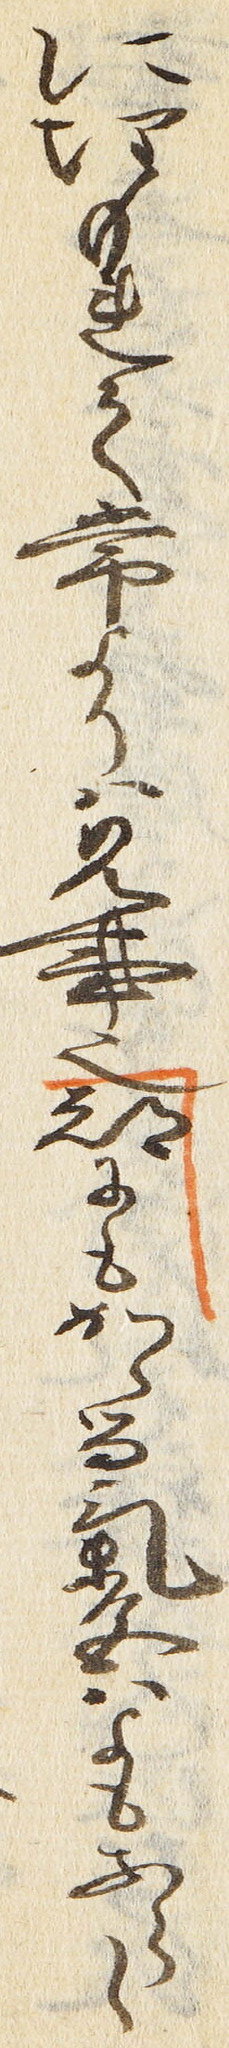に埋もれて常よりは見事也「都にもかかる気色はよもあらし
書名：海陸世話日記
